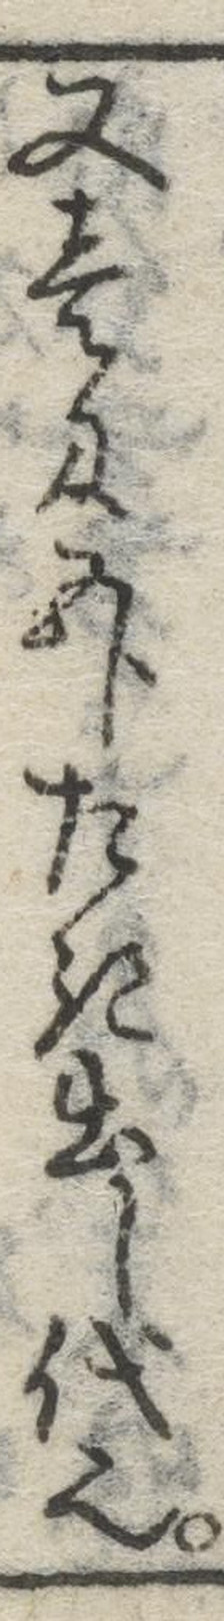又壱匁五分たき出し代也。
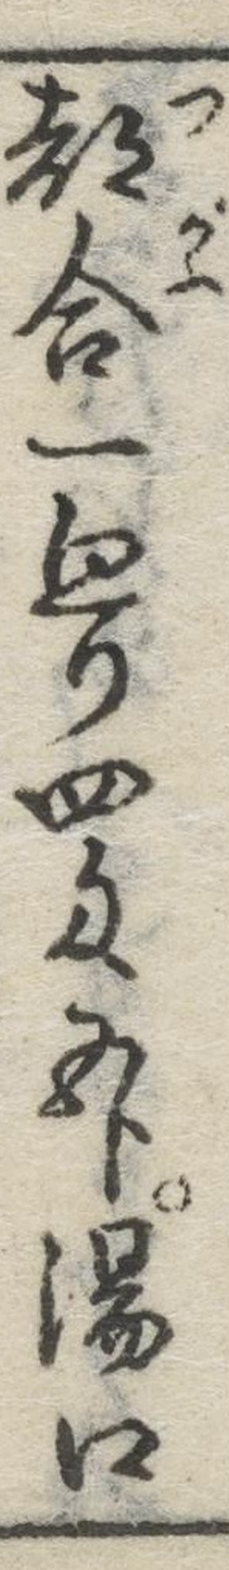都合一廻り四匁五分。湯口
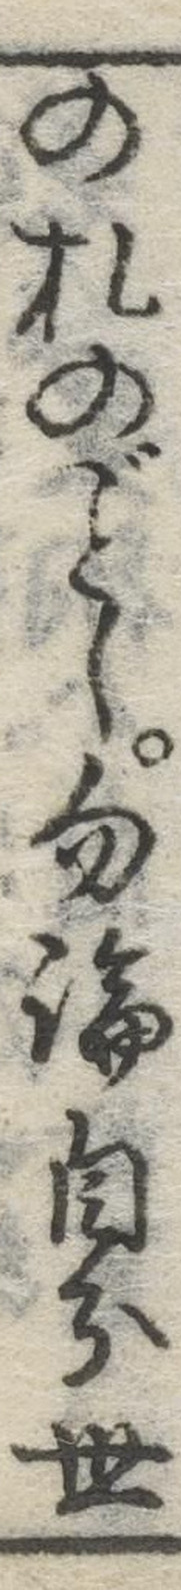の札のごとし。勿論自分世
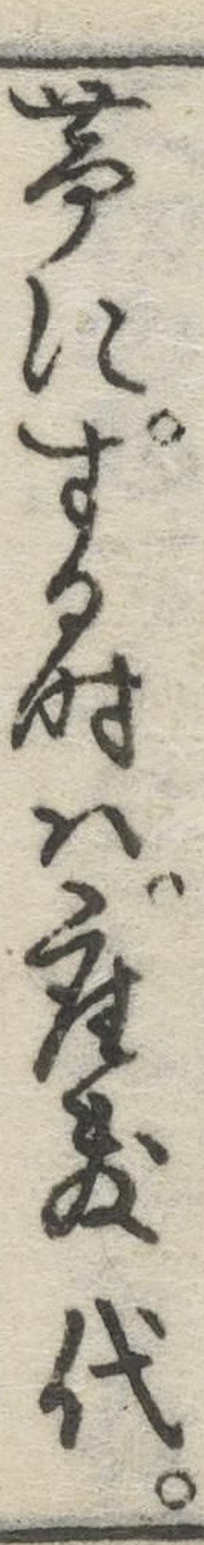帯に。する時は。座敷代。
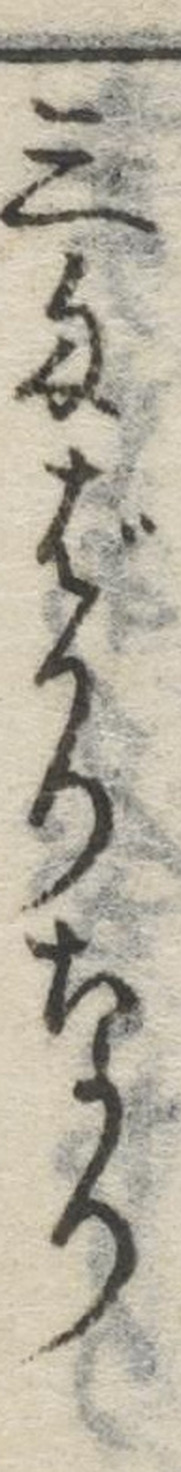三匁ばかりなり
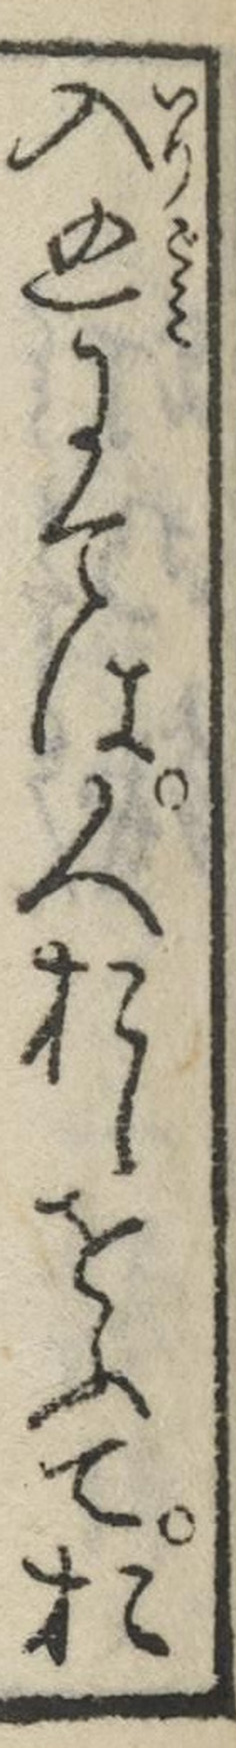入込にては。人おしをふて。お
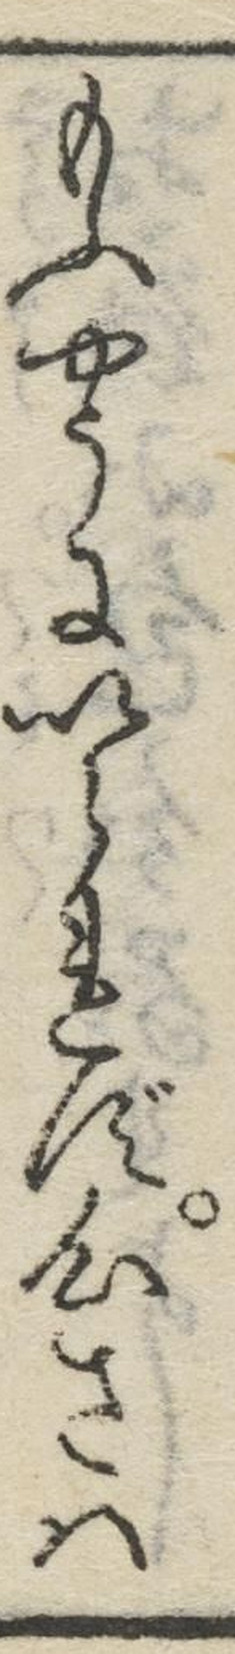もふやうにいられず。心さは
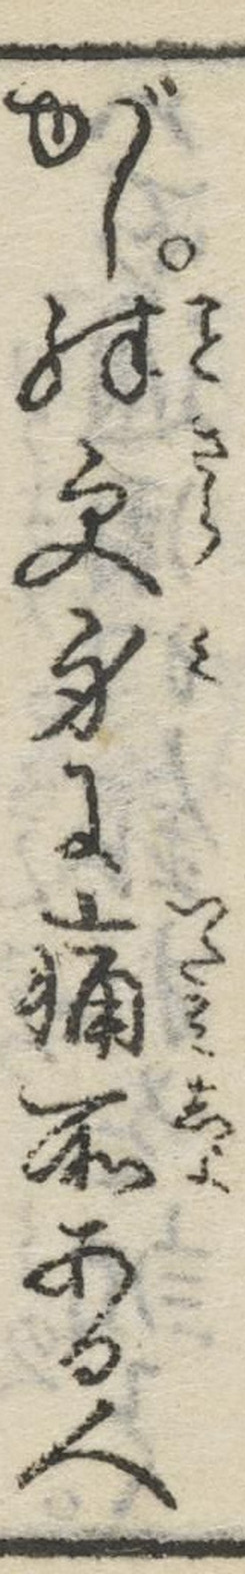がし。殊更身に痛所ある人
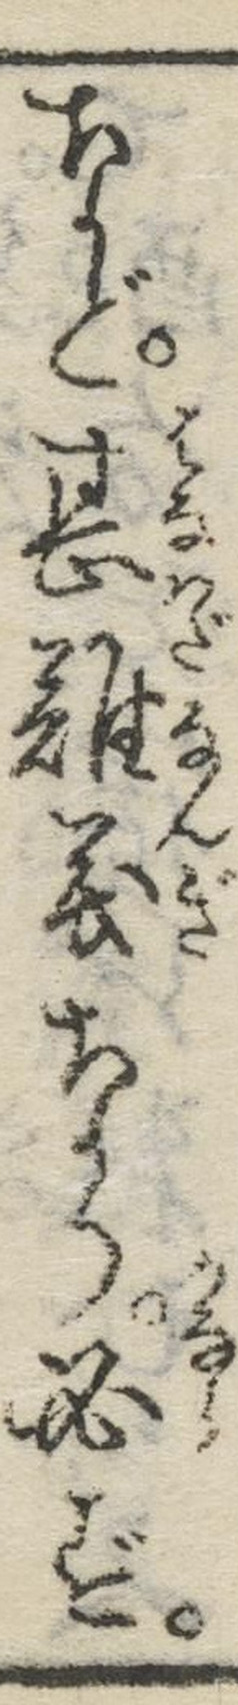など。甚難義なり。必ず。
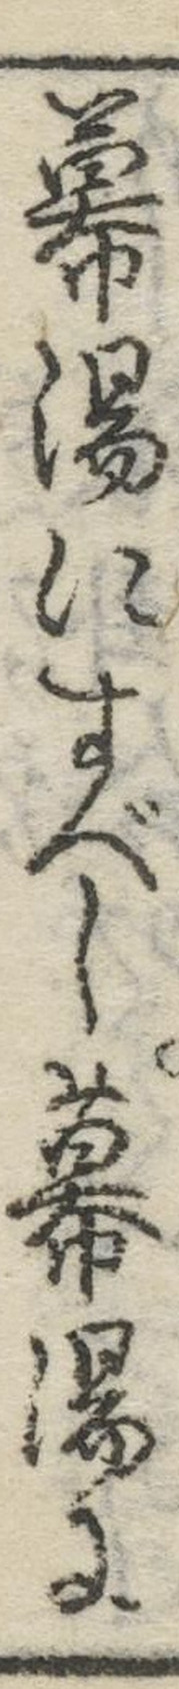幕湯にすべし。幕湯に
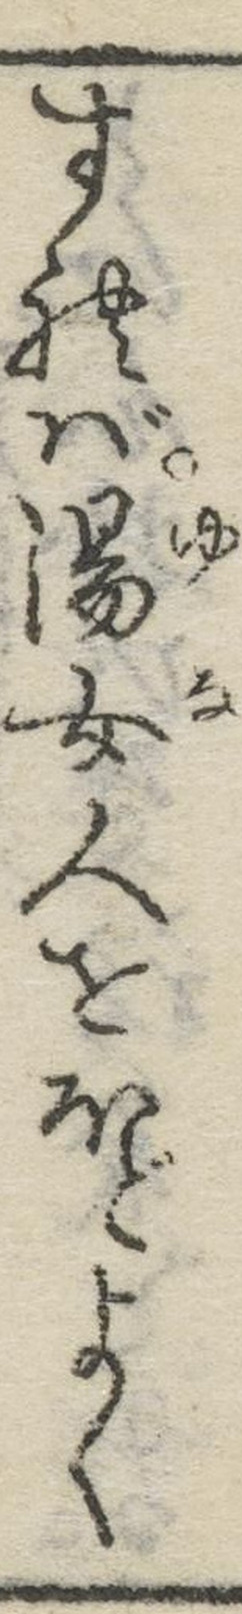すれば。湯女人をほどよく
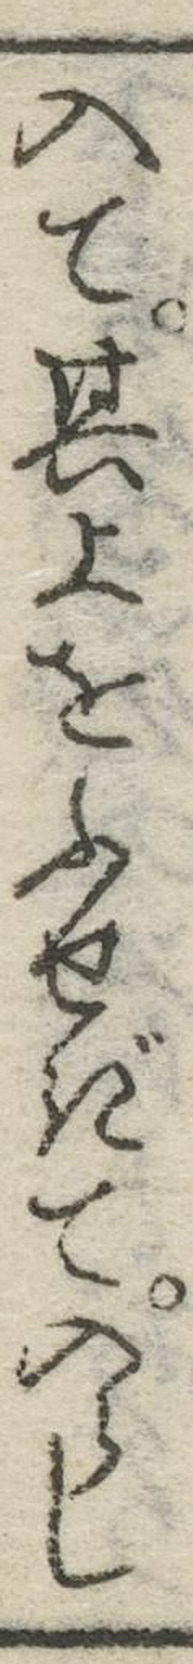入て。其上をふせぎて。入らし
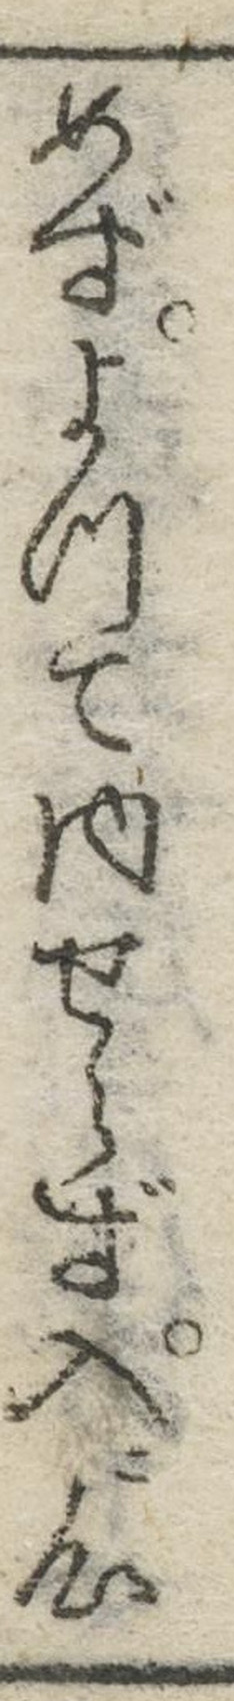めず。よつて内せらず。入に心
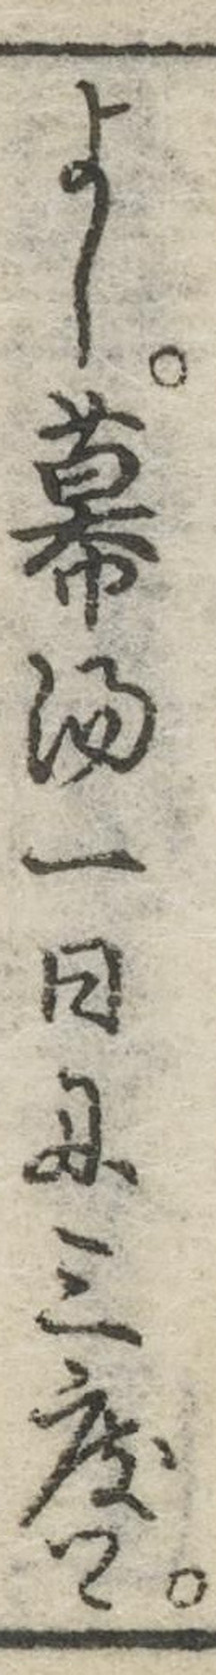よし。幕湯一日二三度つゝ。
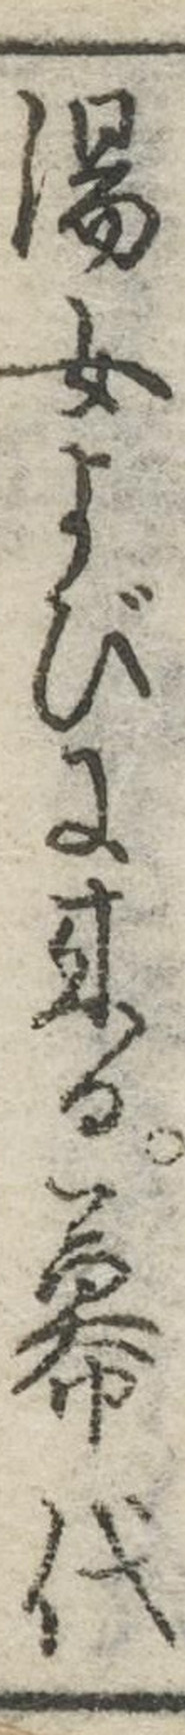湯女よびに来る。幕代
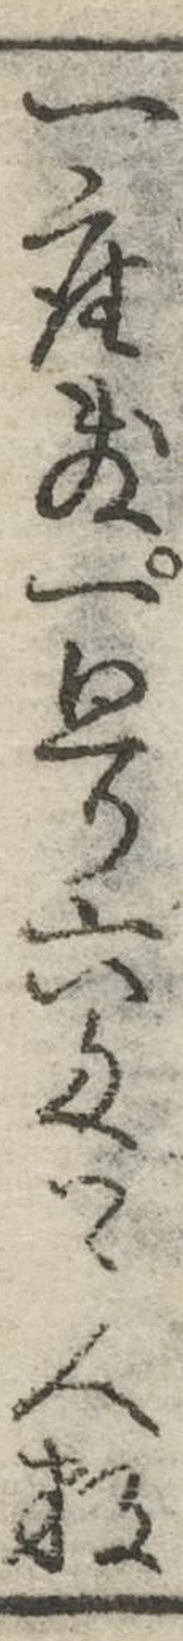一座敷。一廻り六匁つゝ人数
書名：但州城崎浴湯辧
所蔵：東京大学地震研究所図書室 Earthquake Research Institute Library, The University of Tokyo, JAPAN
